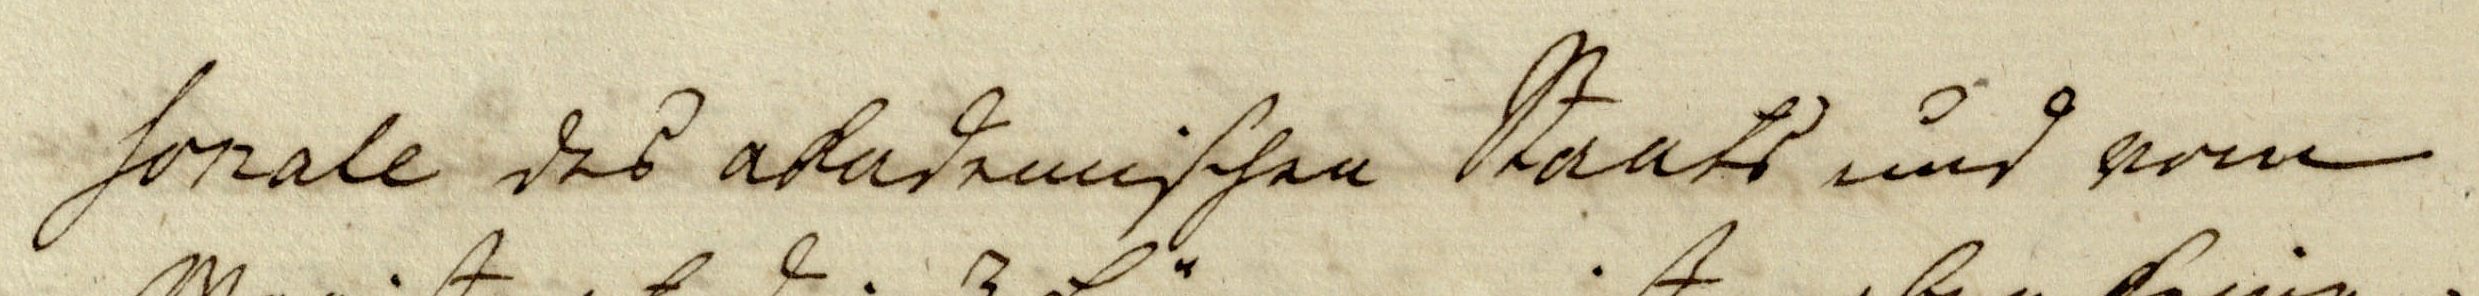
sonale des akademischen Staats und vom
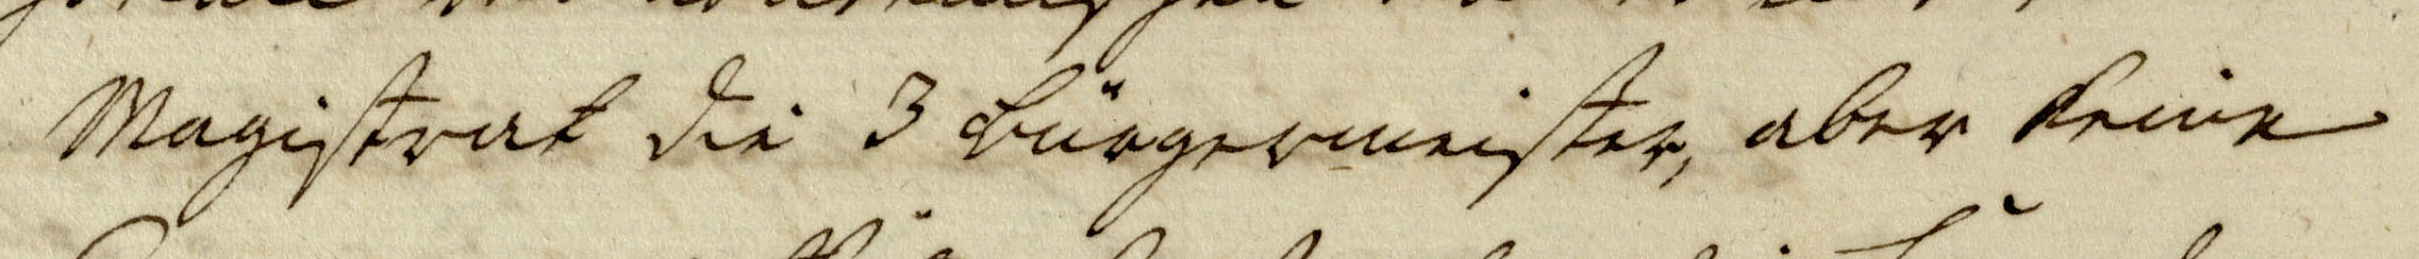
Magistrat die 3 Bürgermeister, aber keine
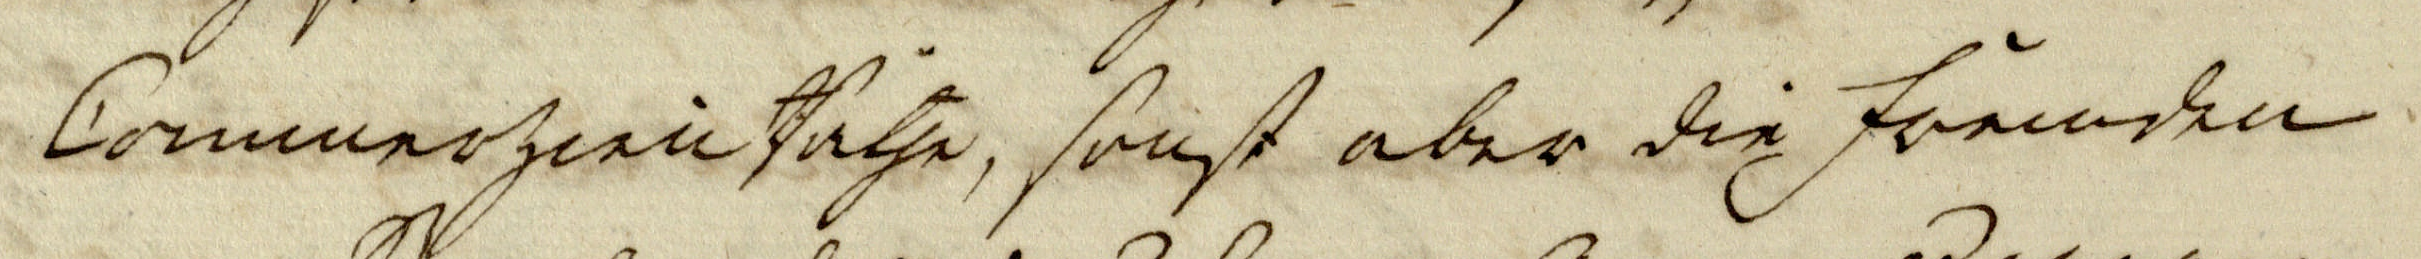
Commerzien Räthe, sonst aber die Fremden
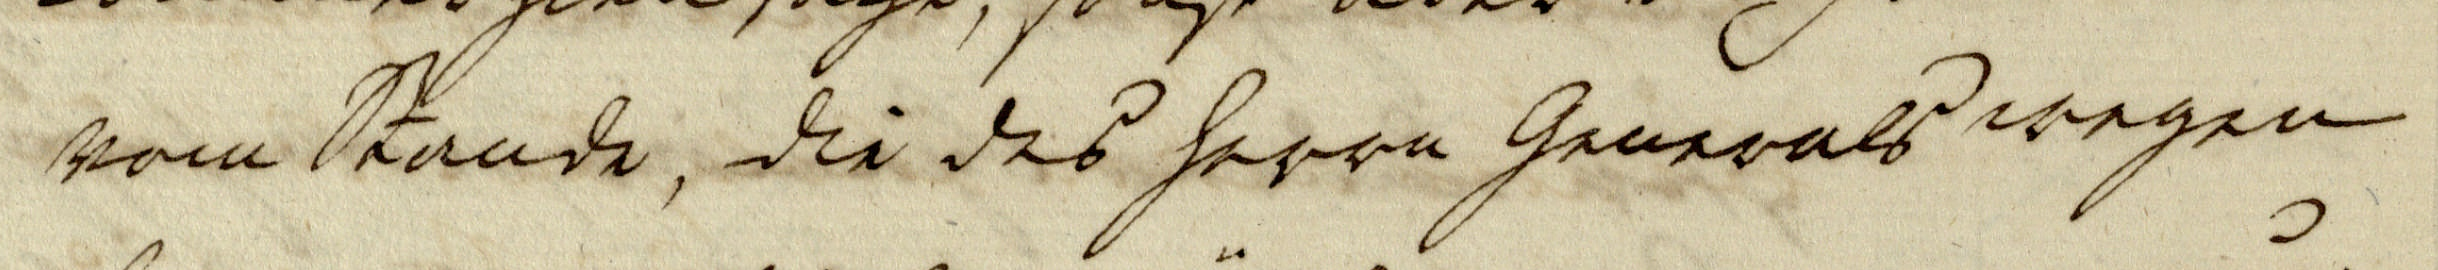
vom Stande, die des Herrn Generals wegen
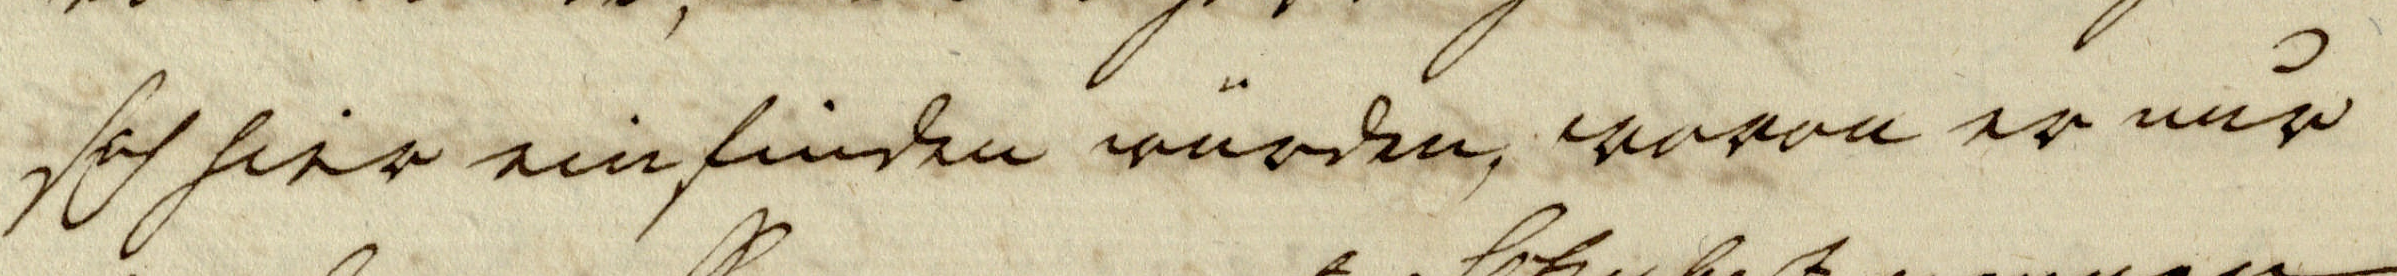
sich hier ein finden würden, wovon er nur
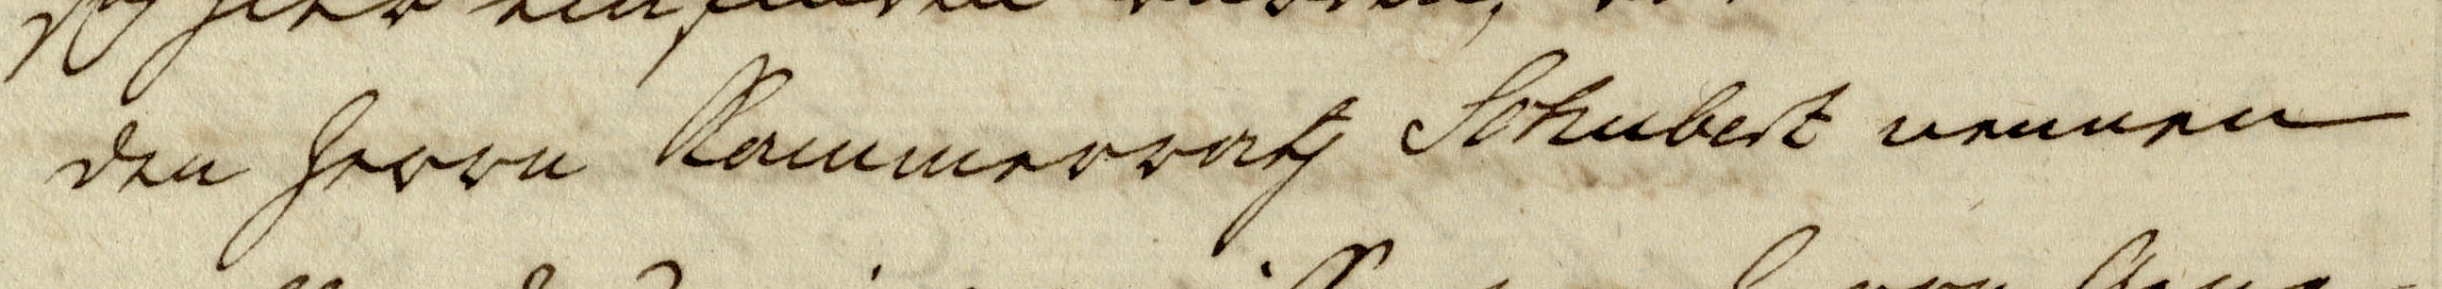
den Herrn Kammerrath Schubert nennen
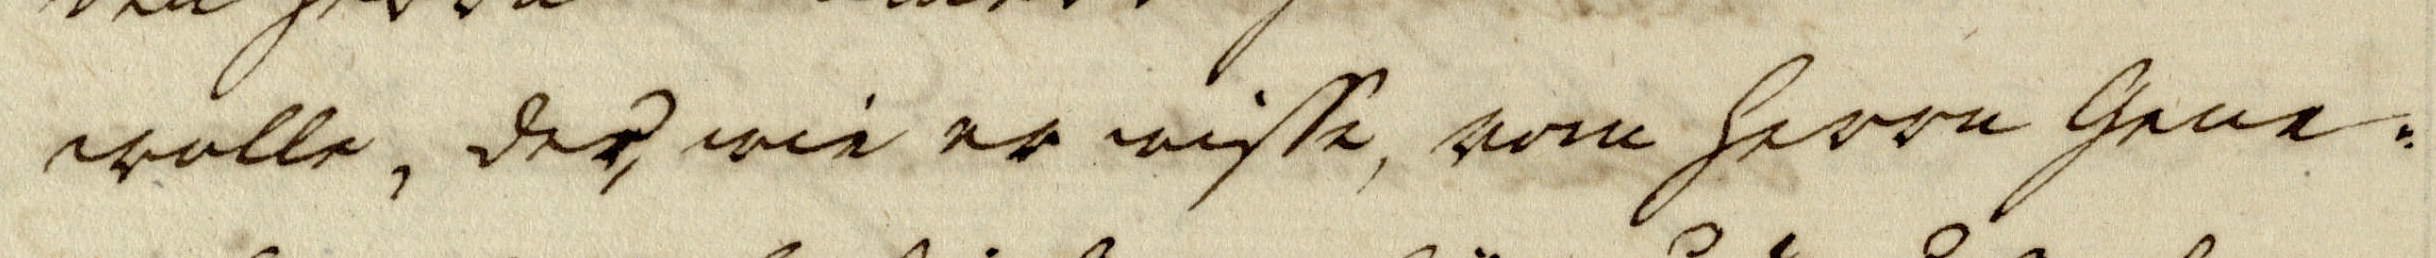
wolle, der wie er wisse, vom Herrn Gene¬
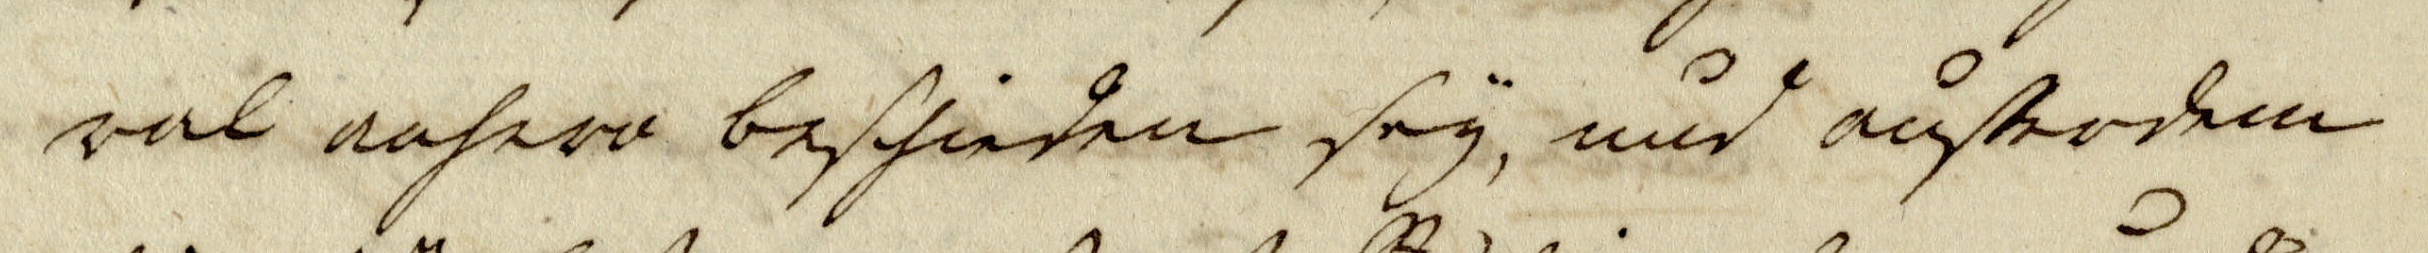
ral anhero beschieden seÿ, und ausserdem
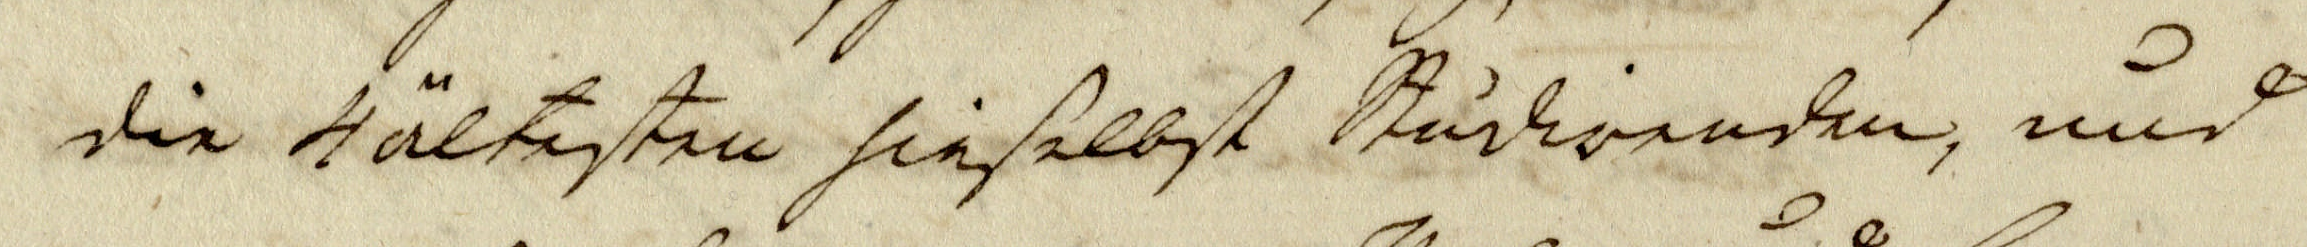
die 4 ältesten hieselbst Studirenden, und
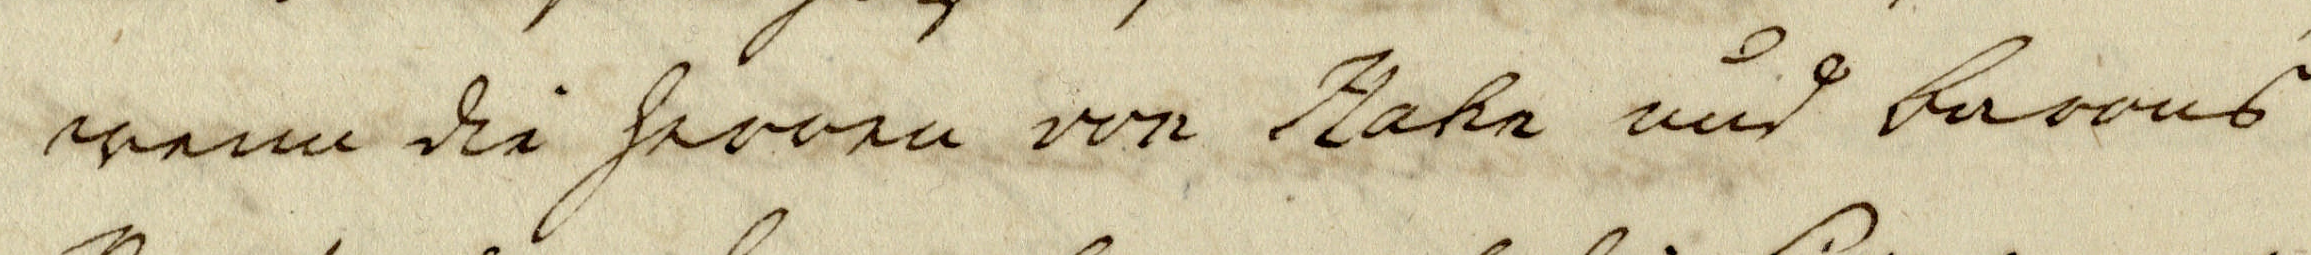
wenn die Herren von Hahn und Barons
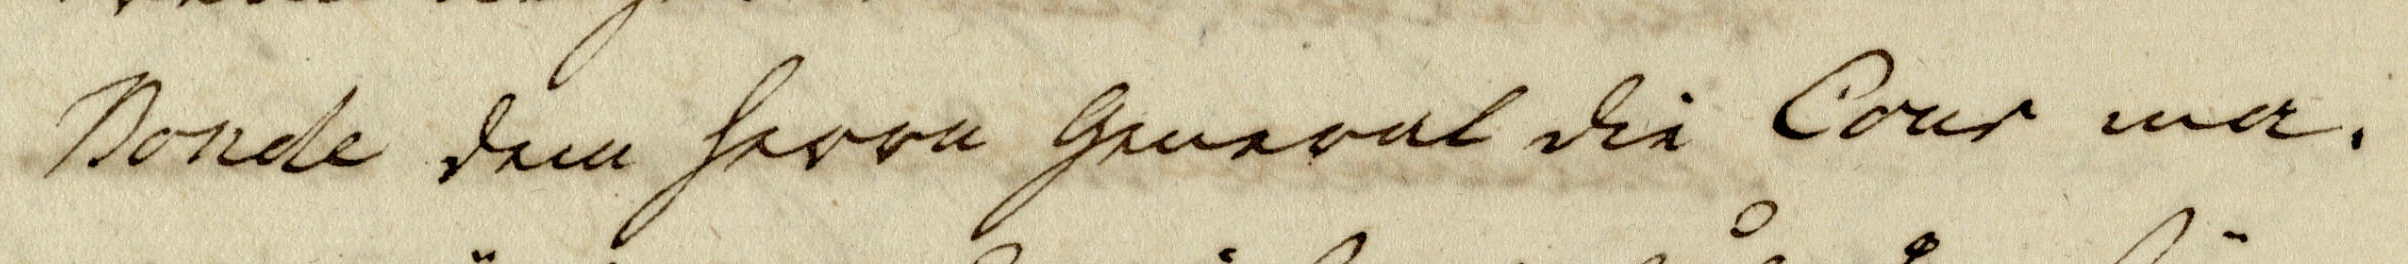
Bonde dem Herrn General die Cour ma¬
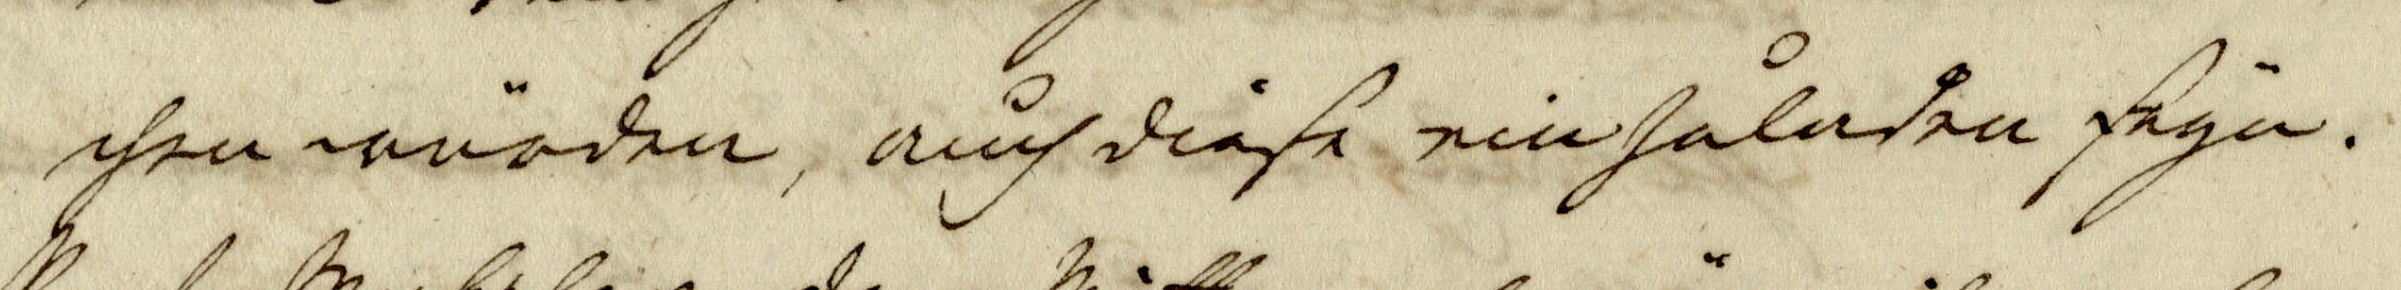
chen würden, auch diese einzuladen seÿn.
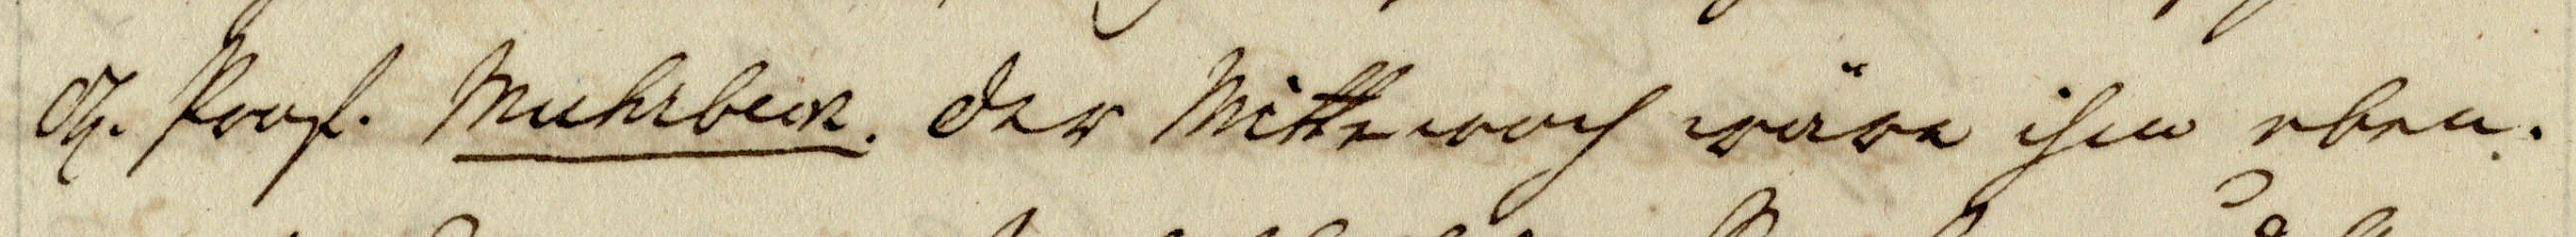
dh. Prof. Muhrbeck. Der Mittewoch wäre ihm eben¬
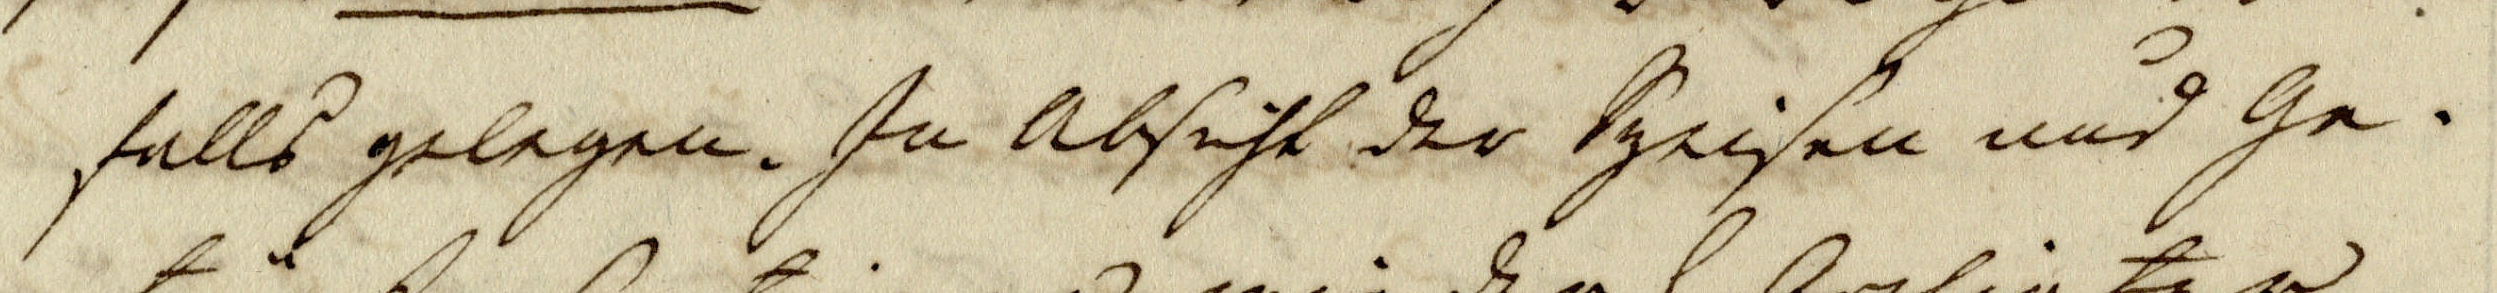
falls gelegen. In Absicht der Speisen und Ge¬
